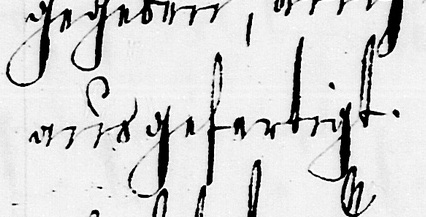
ausgefertigt.
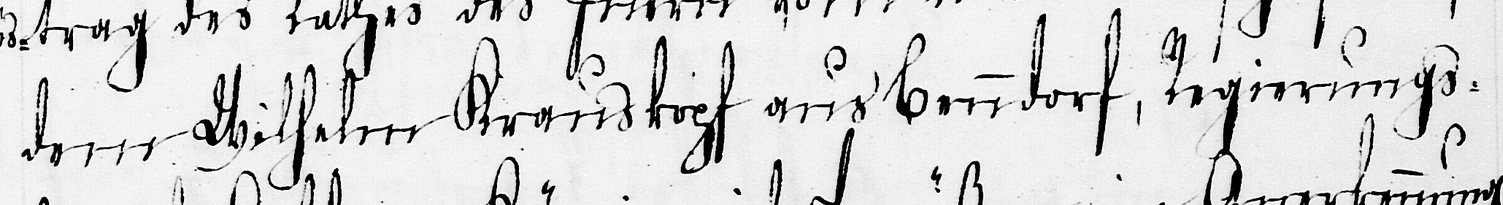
dem Wilhelm Krauskopf aus Benndorf, Regierungs¬
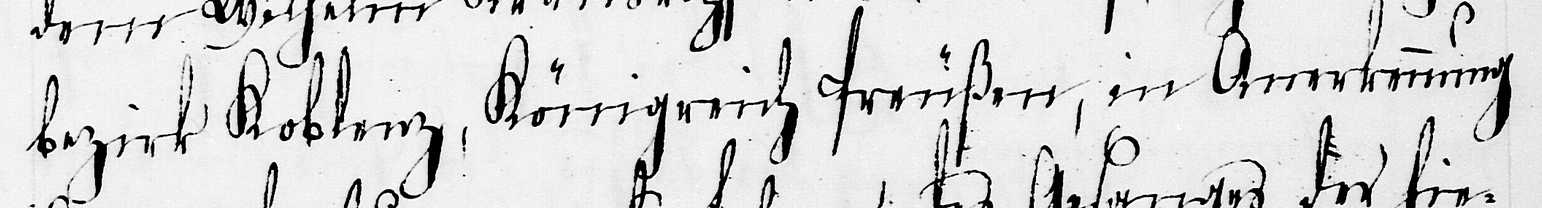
bezirk Koblenz, Königreich Preußen, in Anerkennung
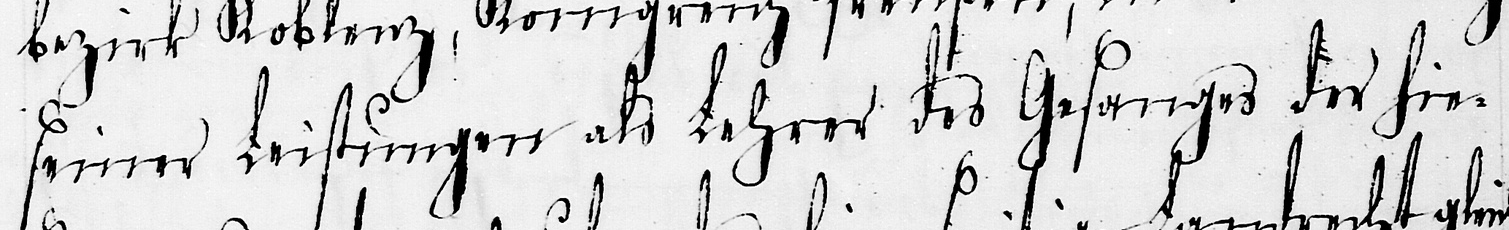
seiner Leistungen als Lehrer des Gesanges der hie¬
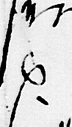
des
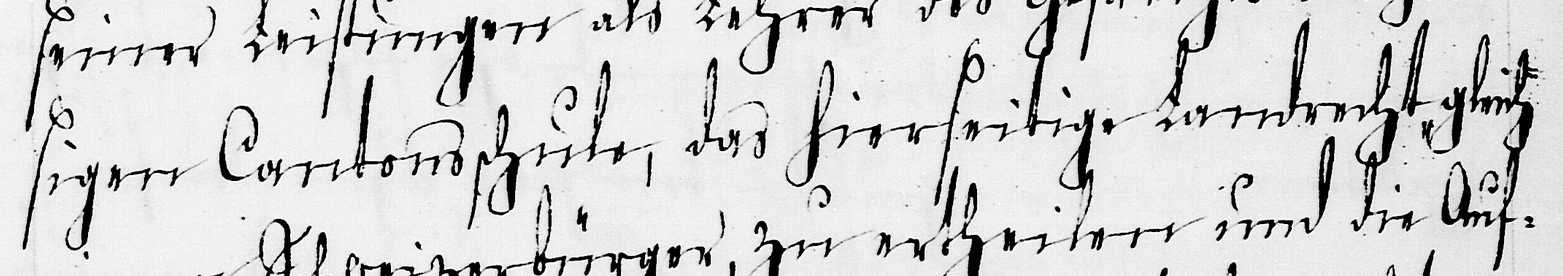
sigen Cantonsschule, das hierseitige Landrecht gleich
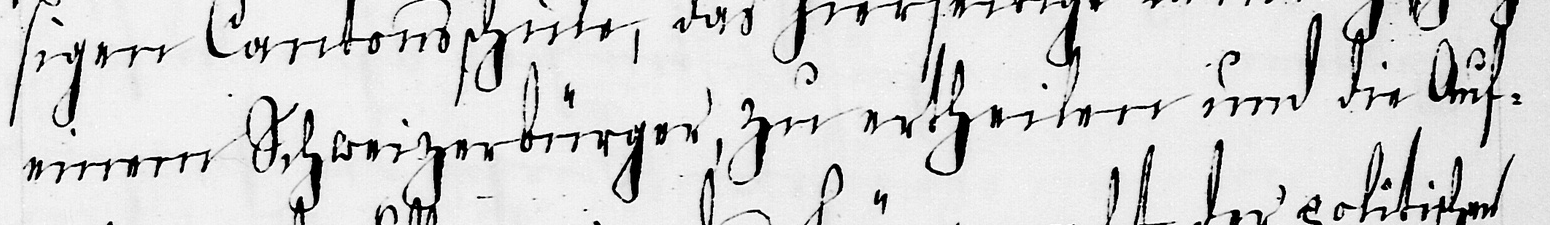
einem Schweizerbürger, zu ertheilen und die Auf¬
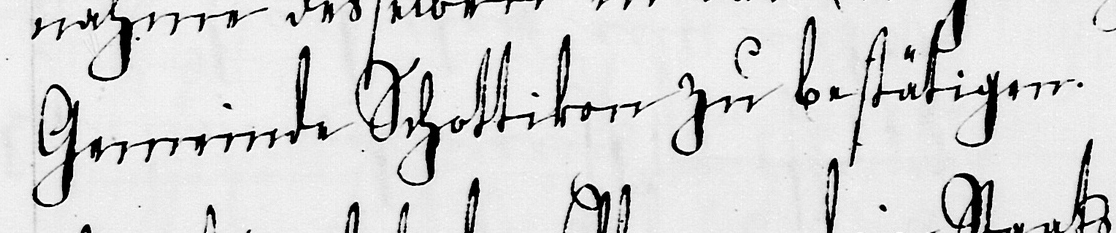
Gemeinde Schottikon zu bestätigen.
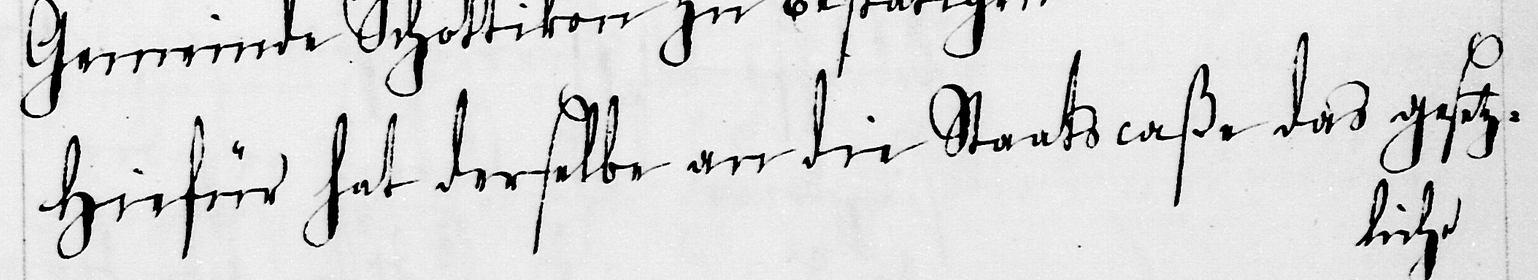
Hiefür hat derselbe an die Staatscaße das gesetz-
